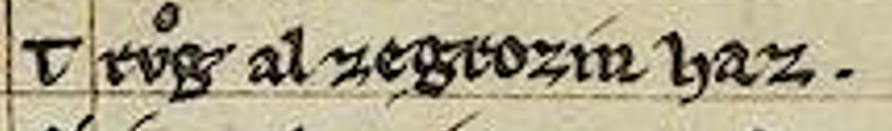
Trv°og al zegrozin haz.
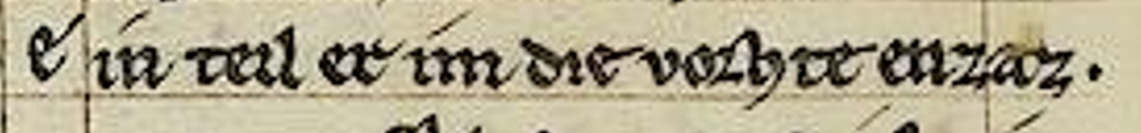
Ein teil er im die vorhte enzaz.
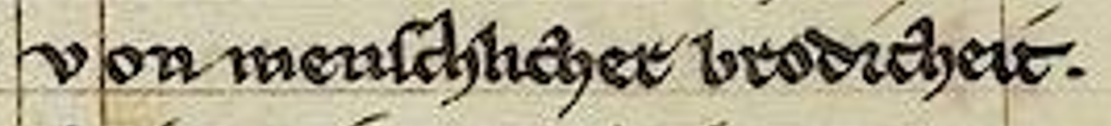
Von menſchlicher brodicheit.
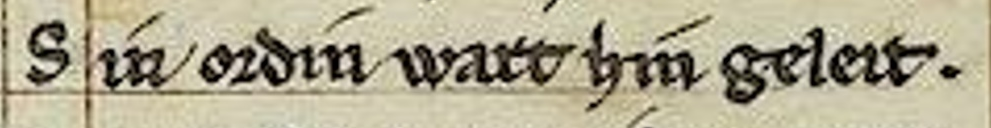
Sin ordin wart hin geleit.
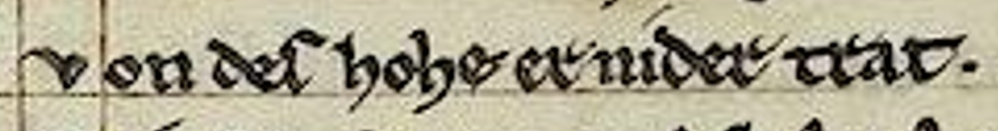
Von deſ hohe er nider trat.
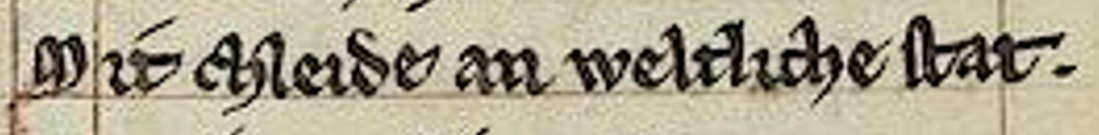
Mit chleide an weltliche ſtat.
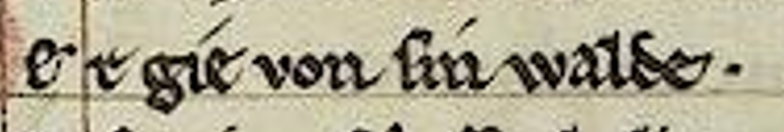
Er gie von ſin walde.
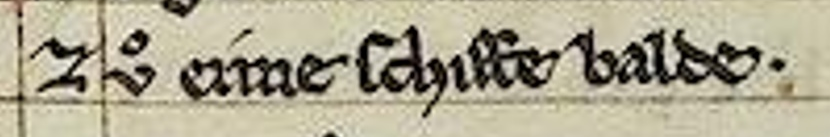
Zv°o eime ſchiffe balde.
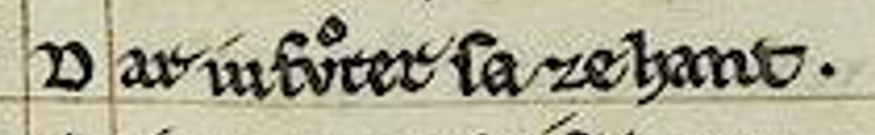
Dar in fv°orer ſa ze hant.
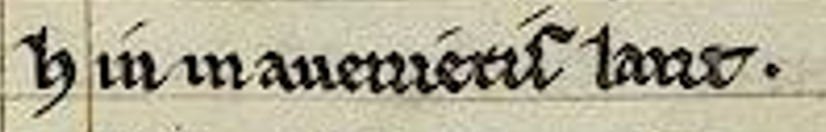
Hin in auenieriſ lant.
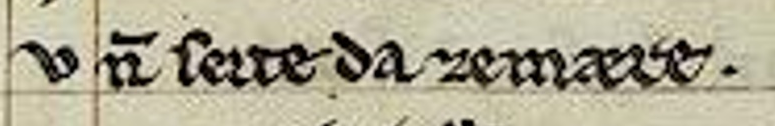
Vn(d) ſeite da zem[ae]re.
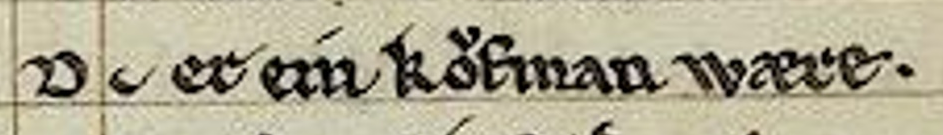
D(az) er ein ko°vfman w[ae]re.
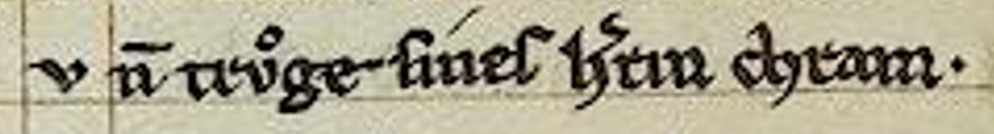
Vn(d) trv°oge ſineſ h(er)rin chram.
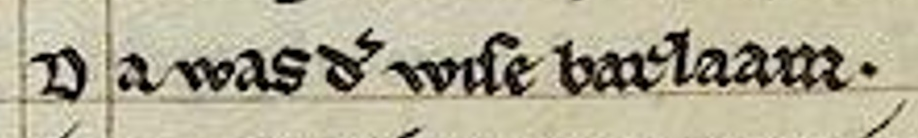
Da was d(er) wiſe barlaam.
